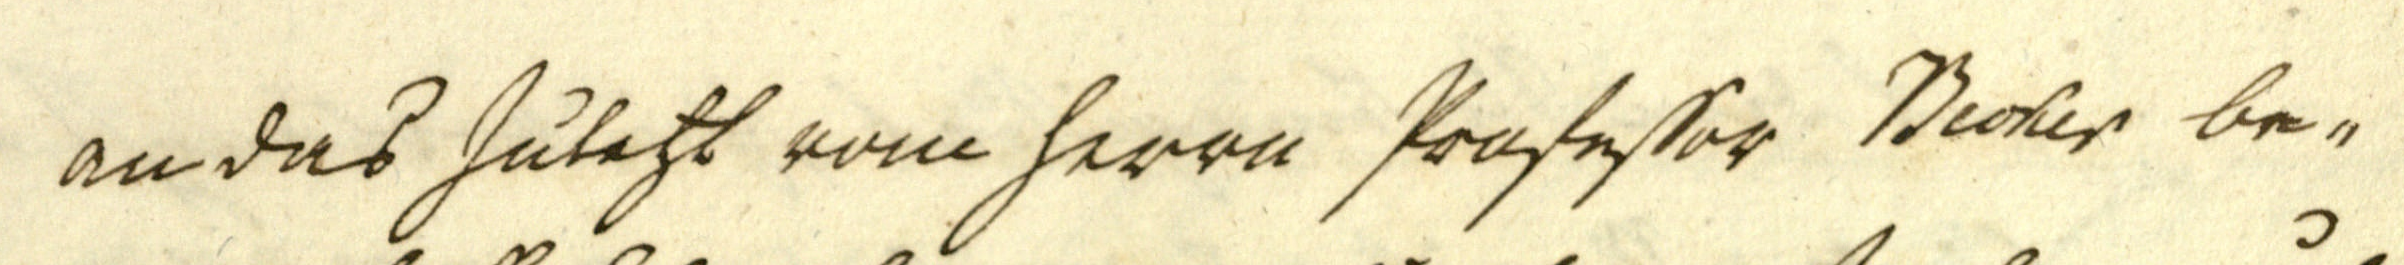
an das zuletzt vom Herrn Professor Becker be¬
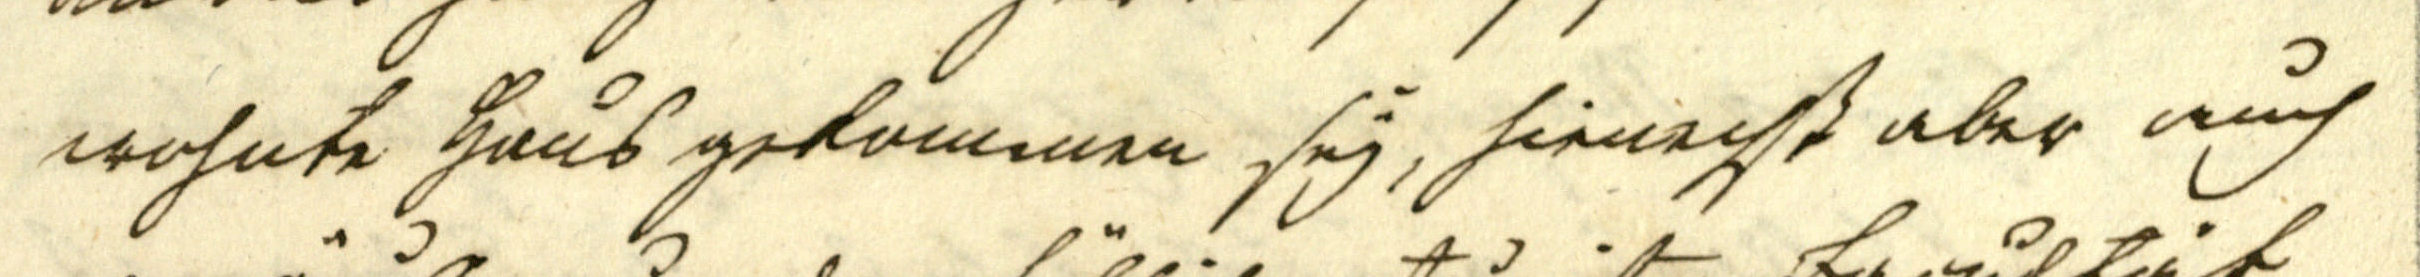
wohnte Haus gekommen seÿ, hienechst aber auch
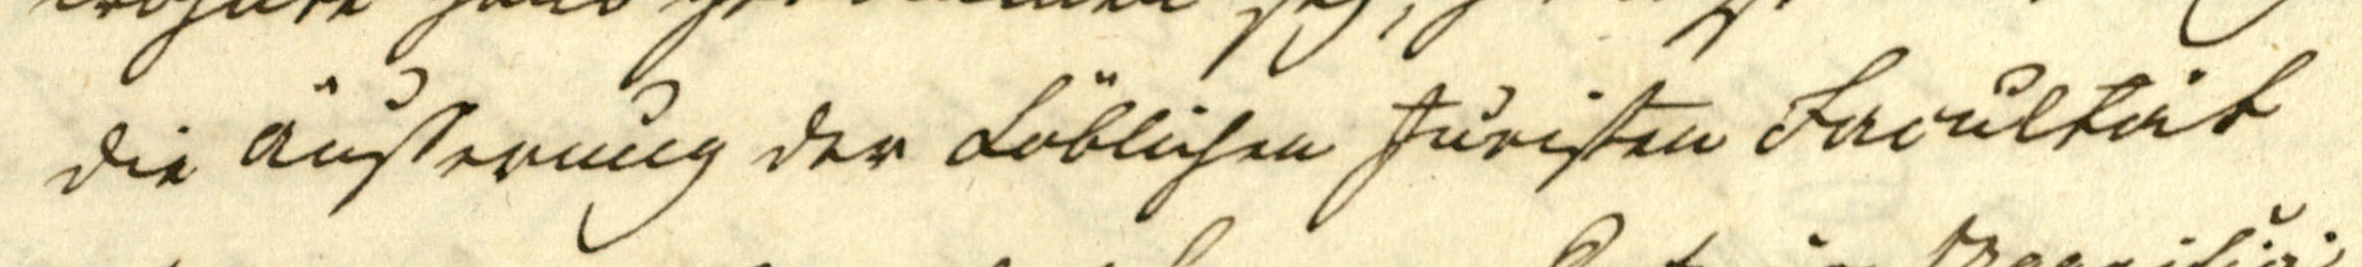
die Äusserung der Löblichen Juristen Facultät
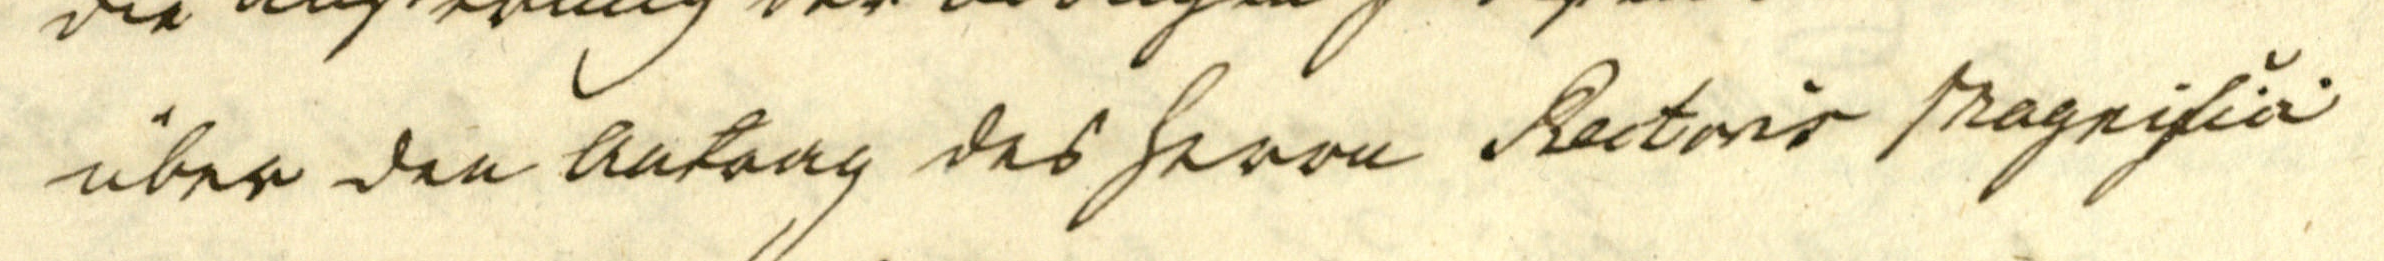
über den Antrag des Herrn Rectoris Magnifici
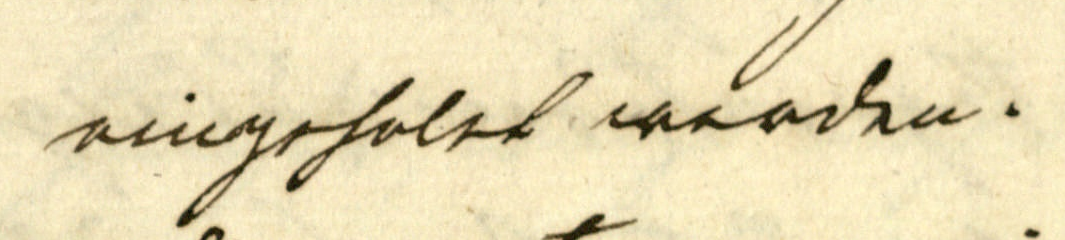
eingeholet werden.
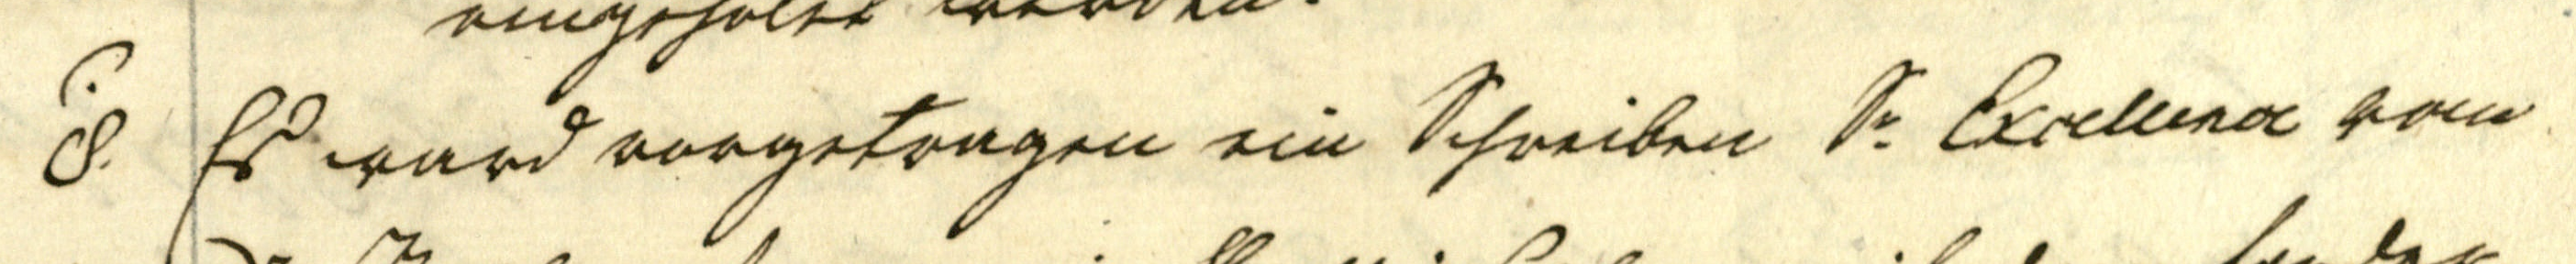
8. Es ward vorgetragen ein Schreiben Sr Excellence vom
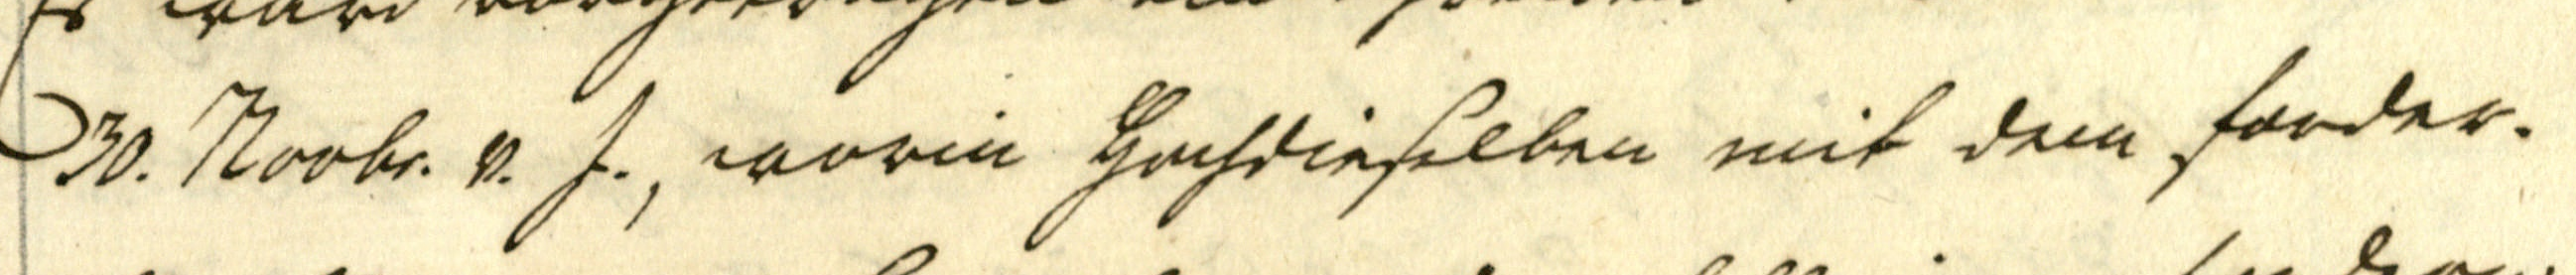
30. Novbr. v. J., worin Hochdieselben mit dem forder¬
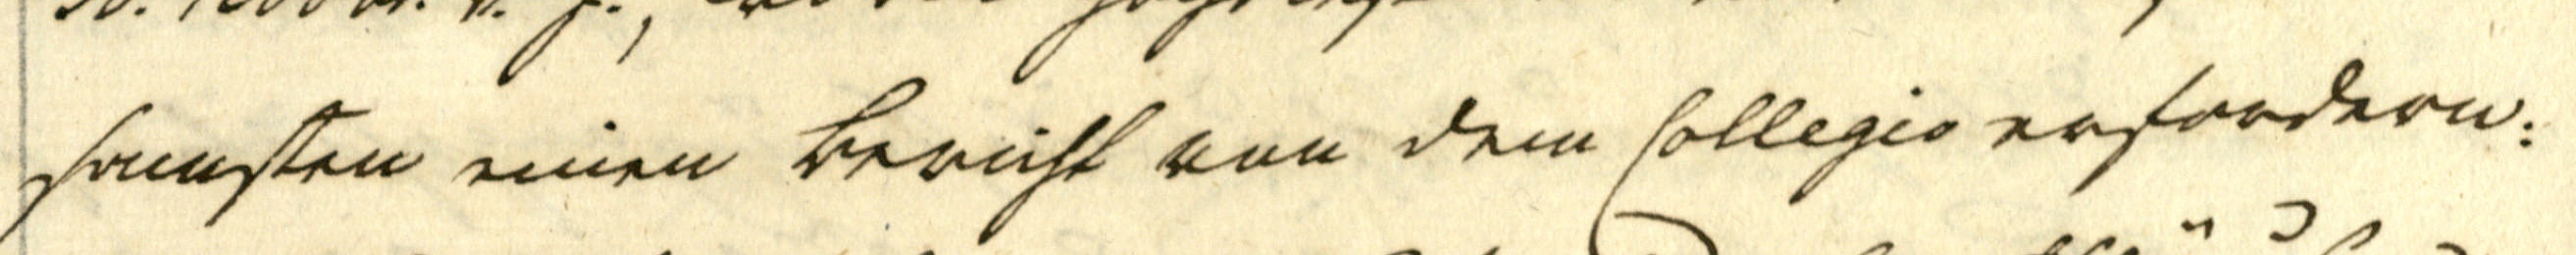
samsten einen Bericht von dem Collegio erfordern:
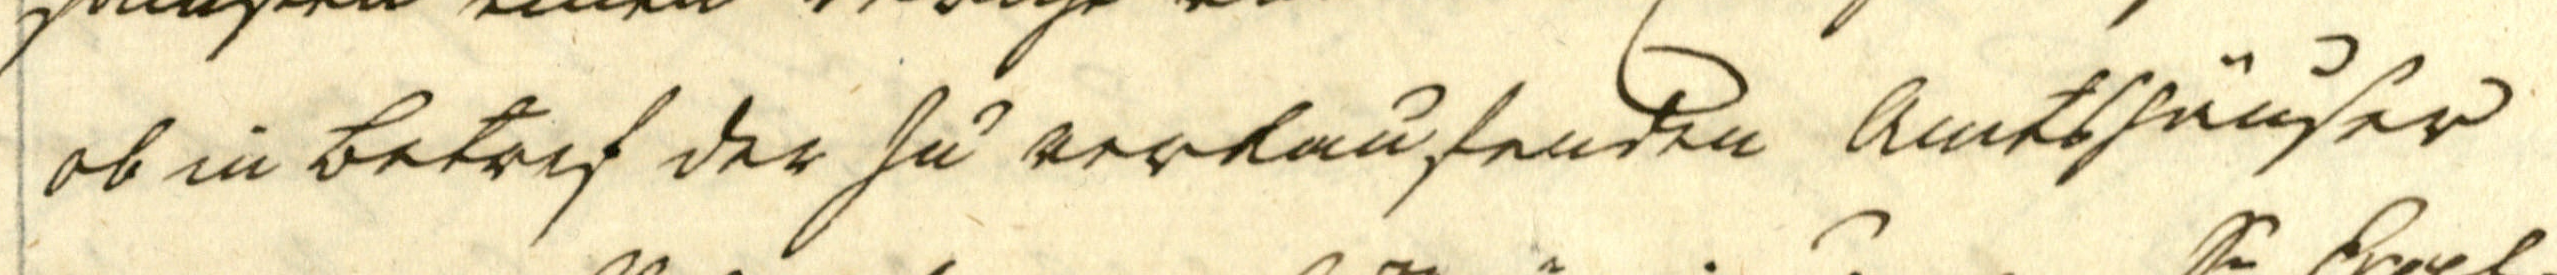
ob in Betref der zu verkaufenden Amtshäuser
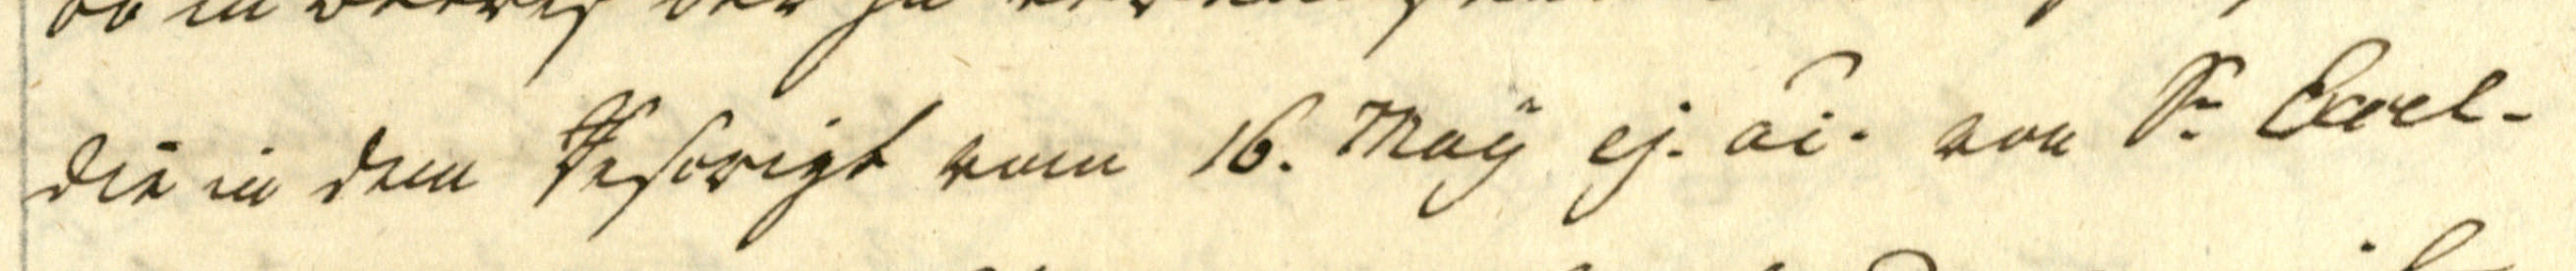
die in dem Rescript vom 16. Maÿ ej. ai. von Sr Excel¬
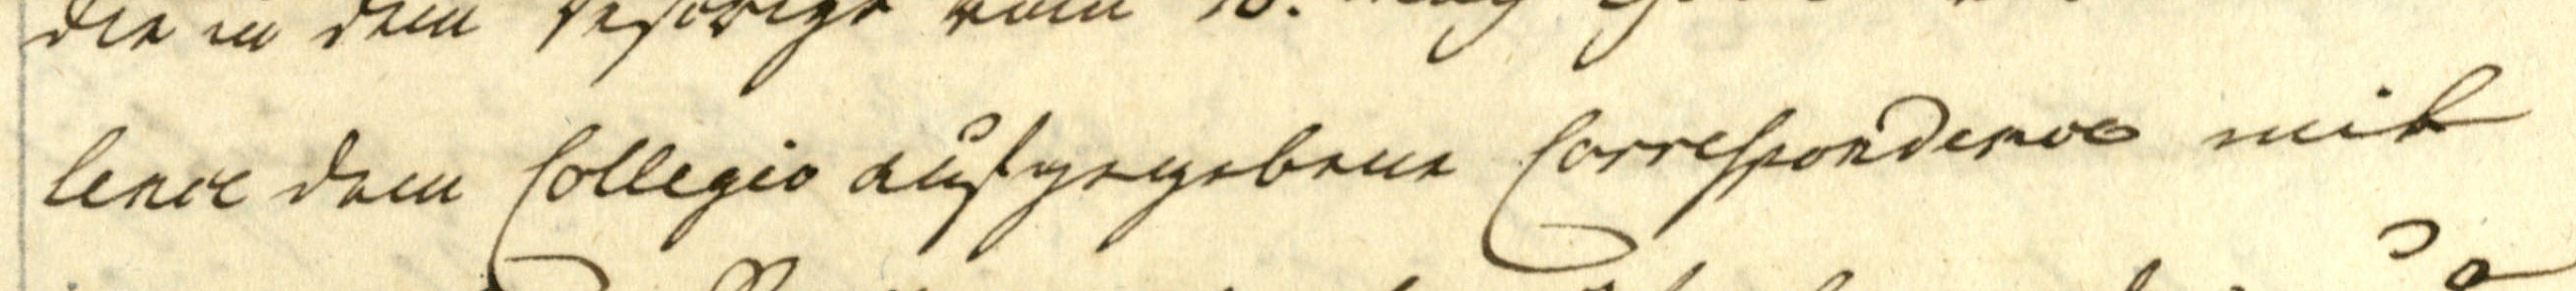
lence dem Collegio aufgegebene Correspondence mit
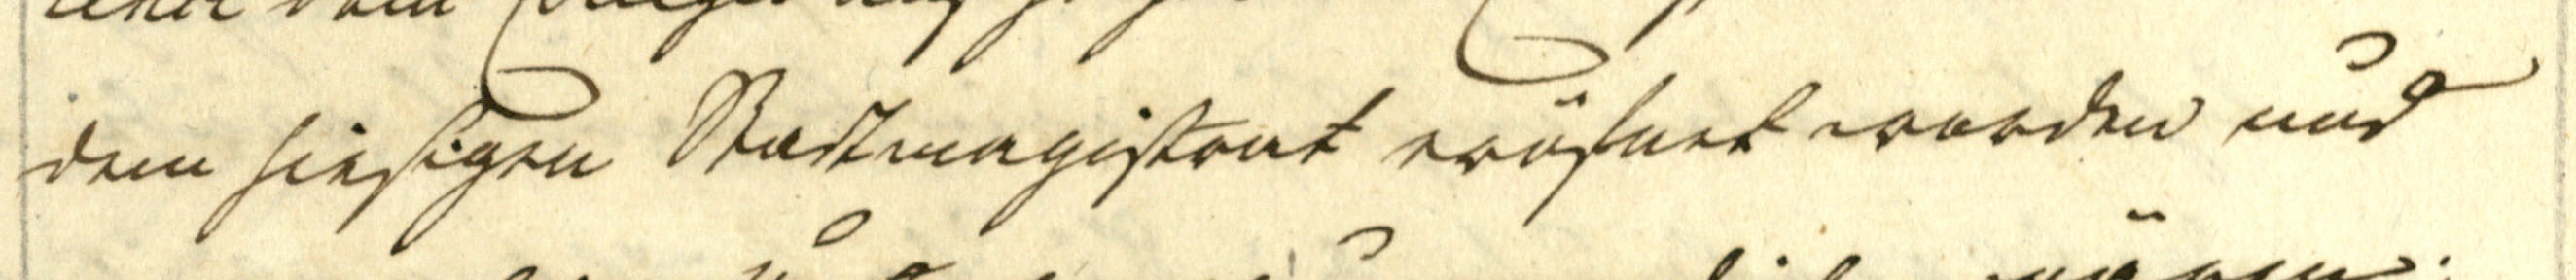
dem hiesigen Stadtmagistrat eröfnet worden und
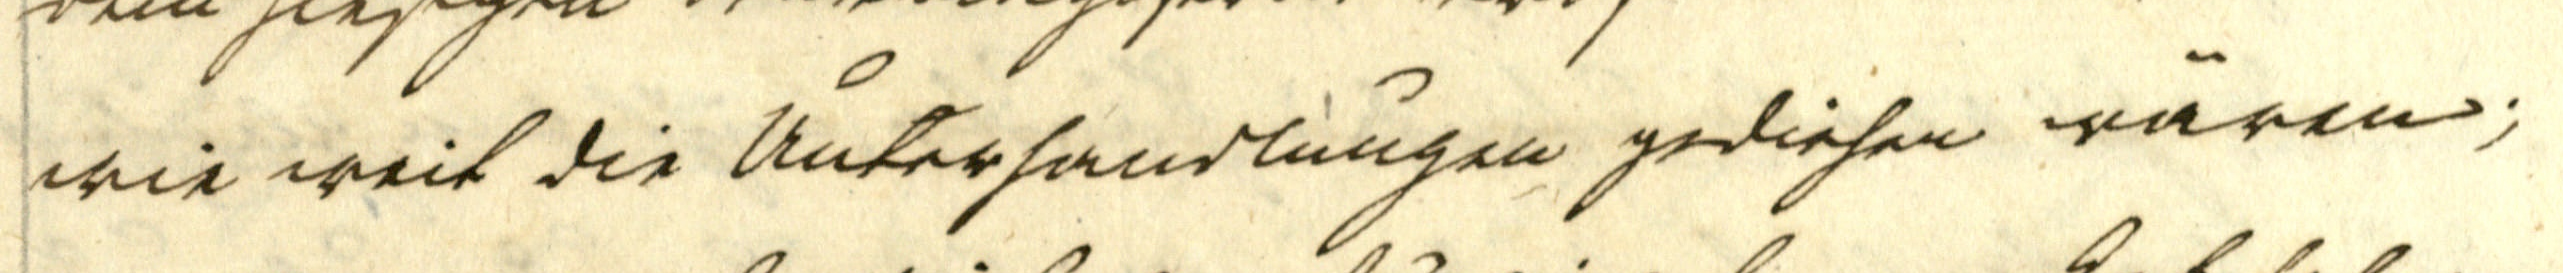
wie weit die Unterhandlungen gediehen wären;
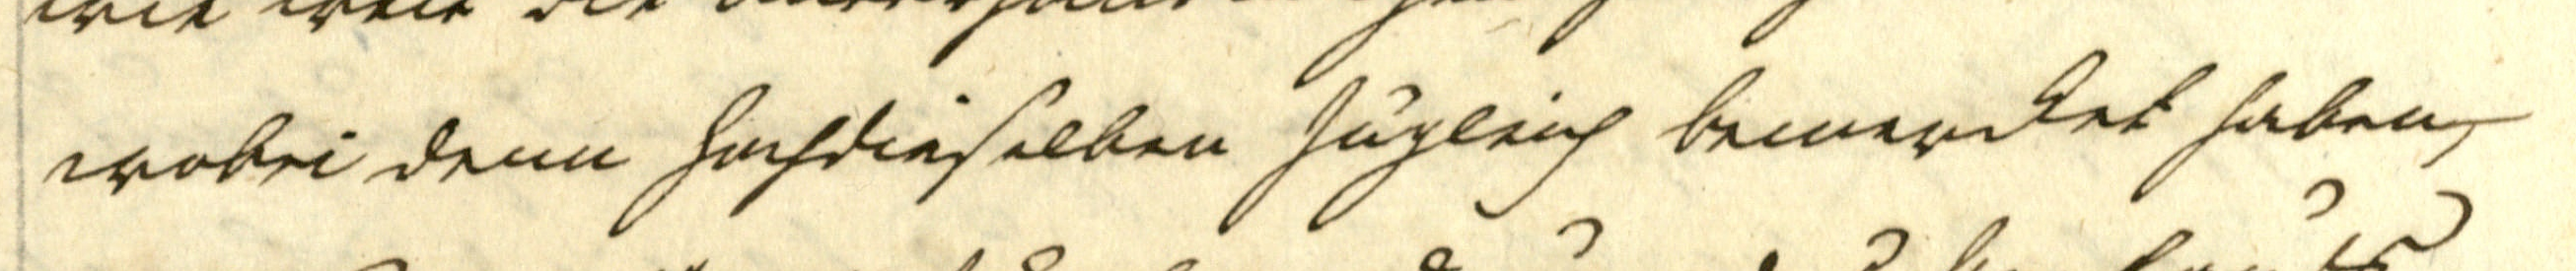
wobei denn Hochdieselben zugleich bemercket haben,
